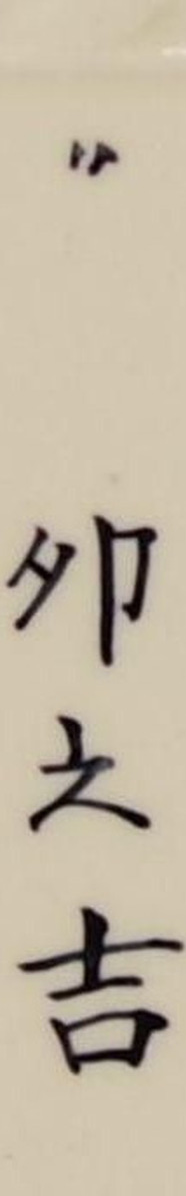卯之吉
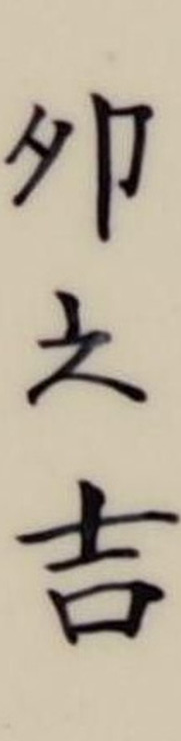卯之吉
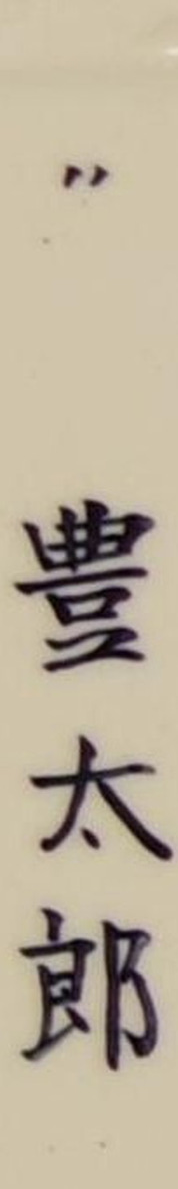豊太郎
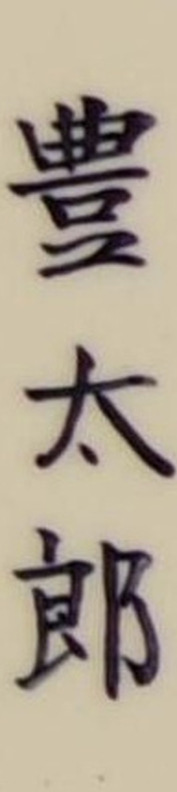豊太郎
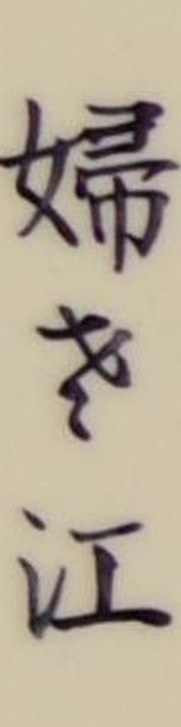ふさ江

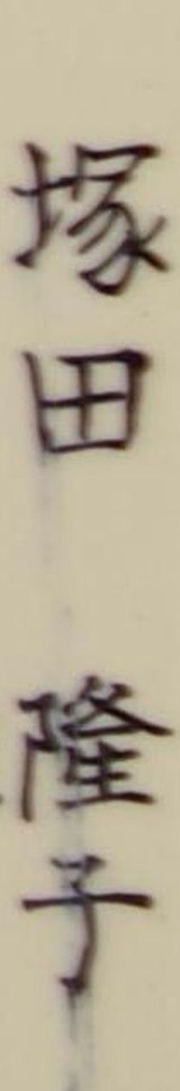塚田隆子
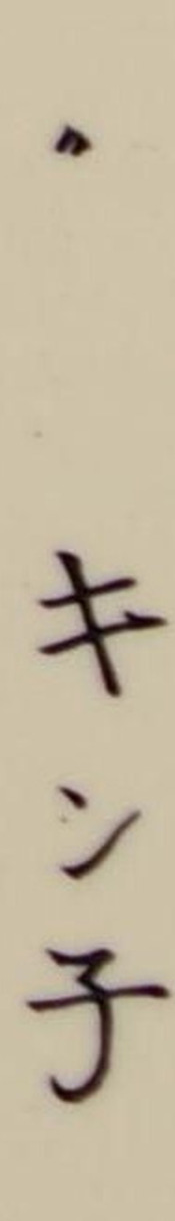キン子
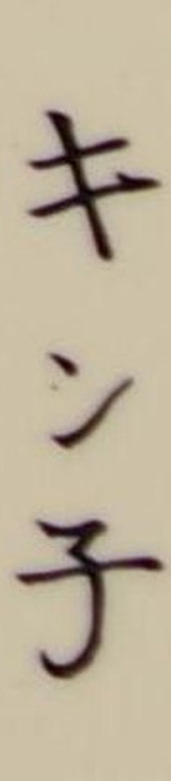キン子
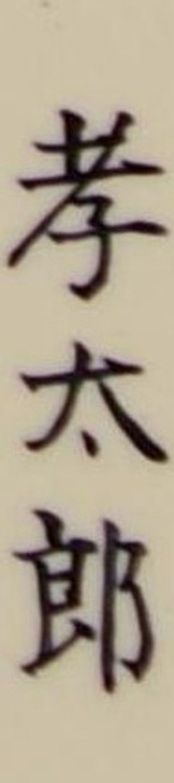孝太郎
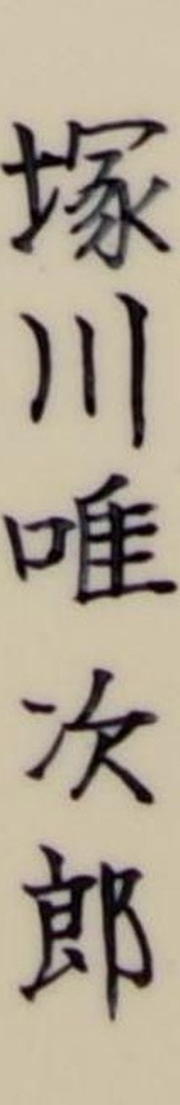塚川唯次郎
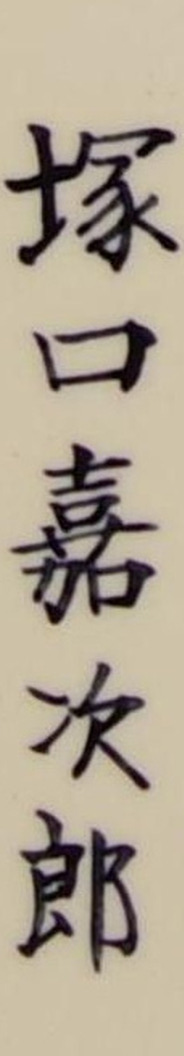塚口嘉次郎
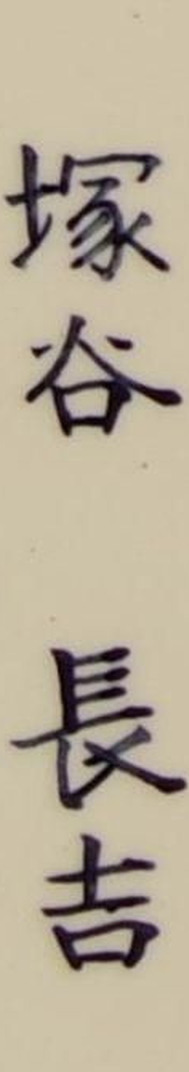塚谷長吉
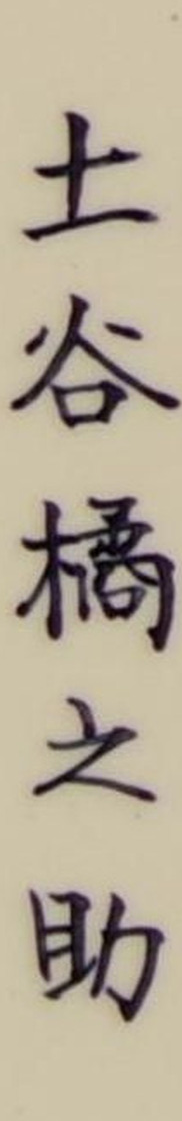土谷橘之助
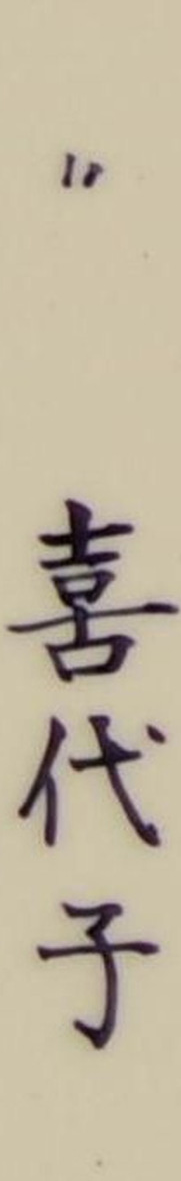喜代子
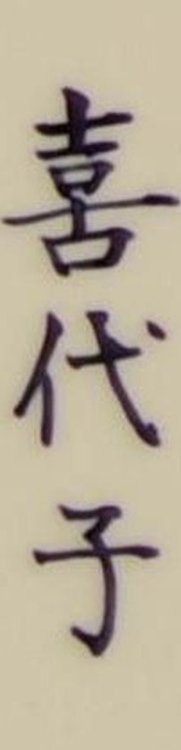喜代子

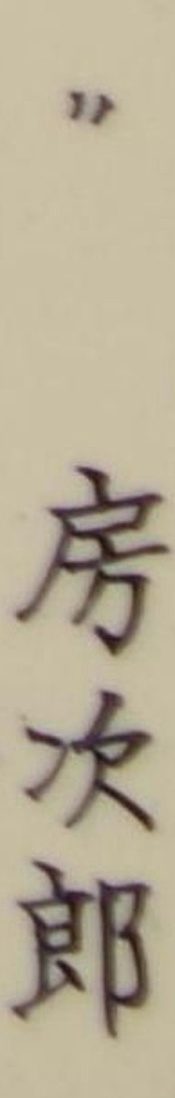房次郎
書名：E~L
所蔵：高野山金剛峯寺
